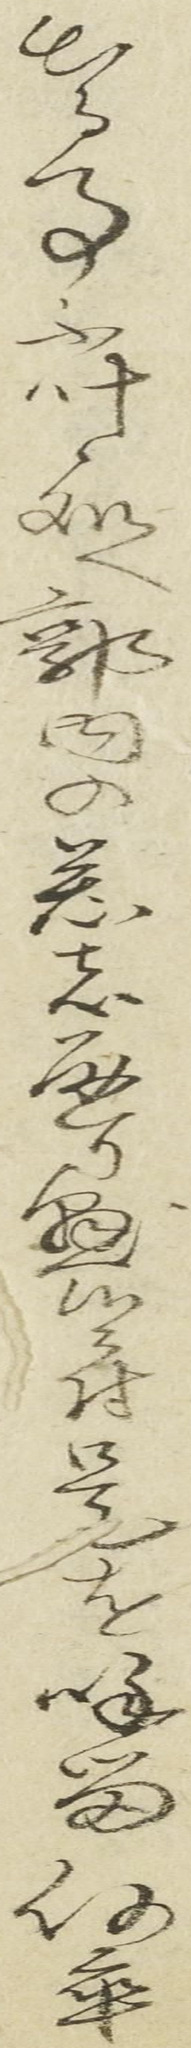出る事不叶候処へ郭内の若者通り懸候ニ付是を呼留何卒
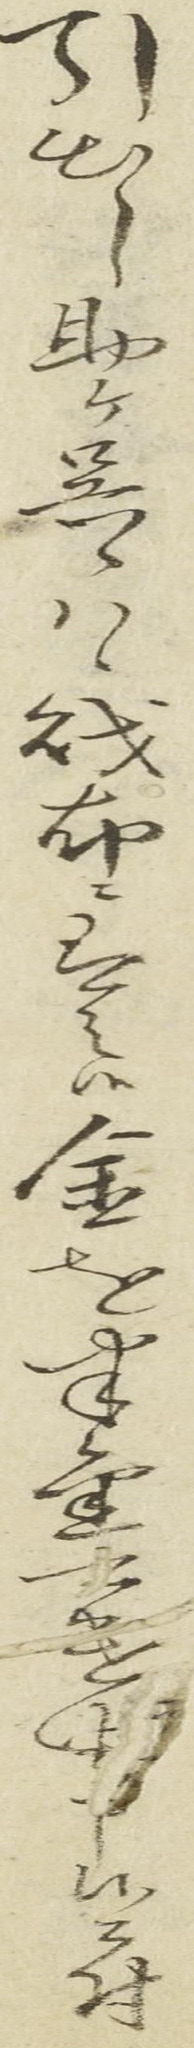引出し助ケ呉候ハゝ財布ニ有之候金を半金可遣由申候ニ付
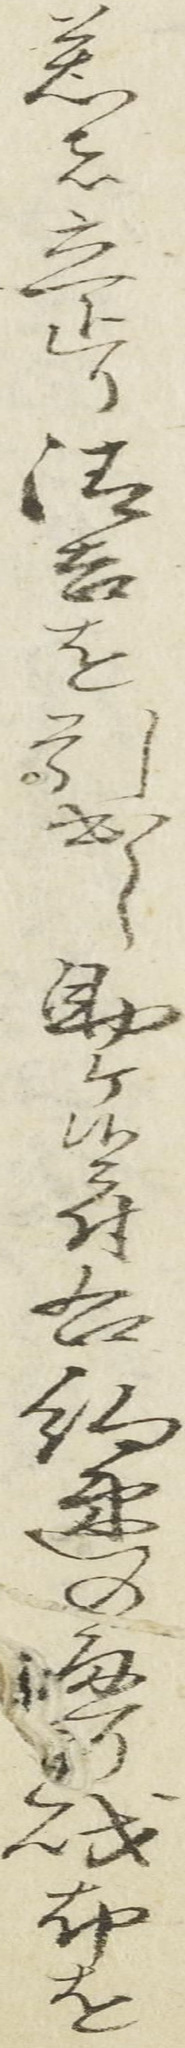若者立止り清吉を引出し助け候ニ付右約束の通り財布を
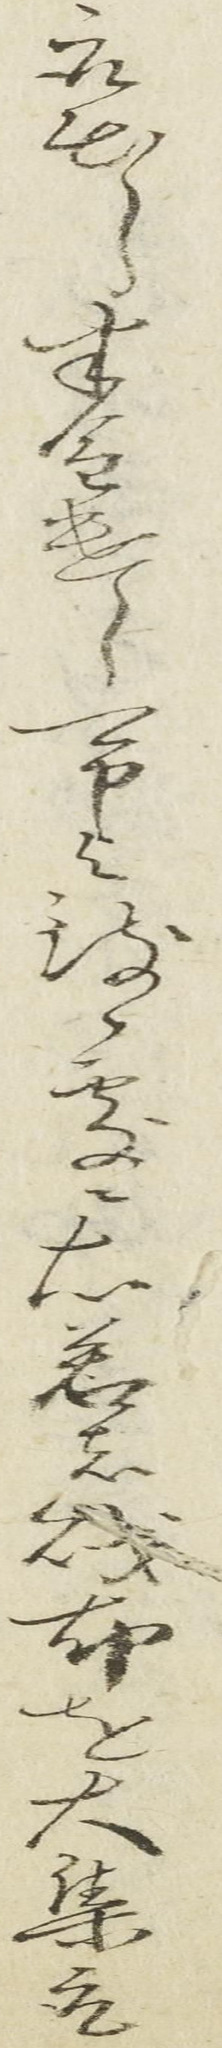取出し半金遣し可申と致候処ニ右若者財布を大集取
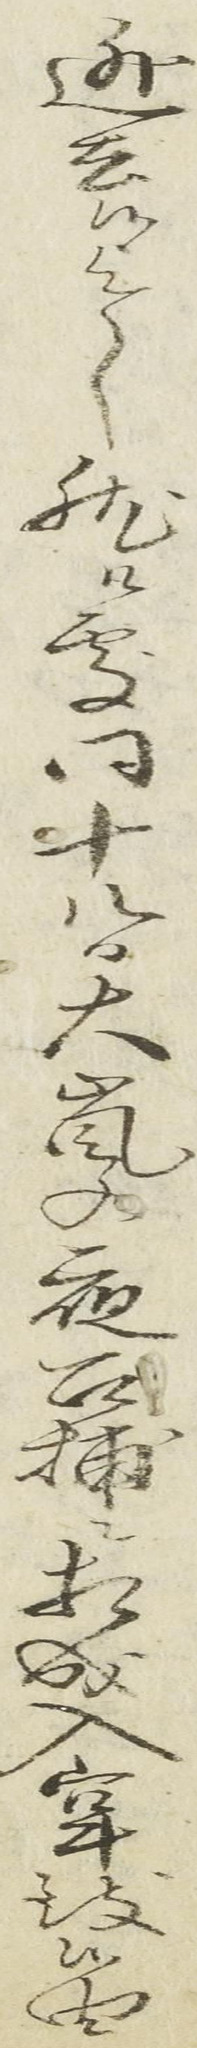逃去ルよし然ル処同十八日大嵐の夜召捕ニ相成入牢致候由
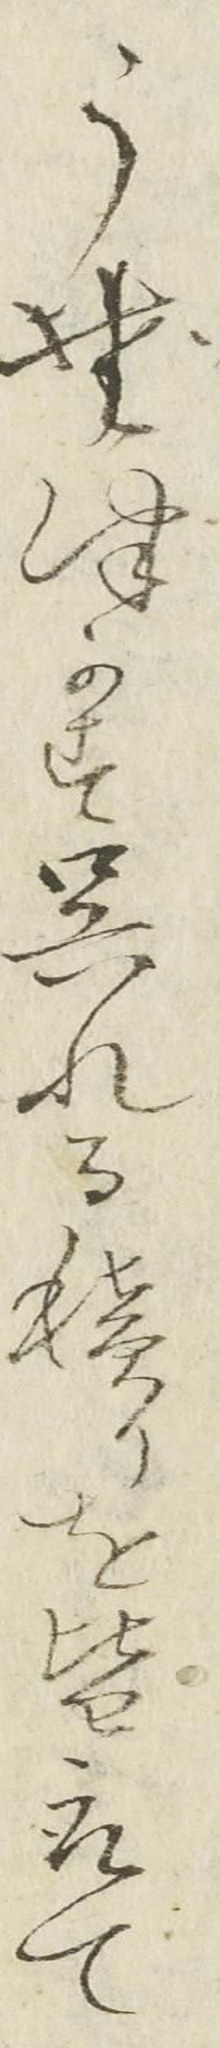うそつかす呉れる積りを皆取て
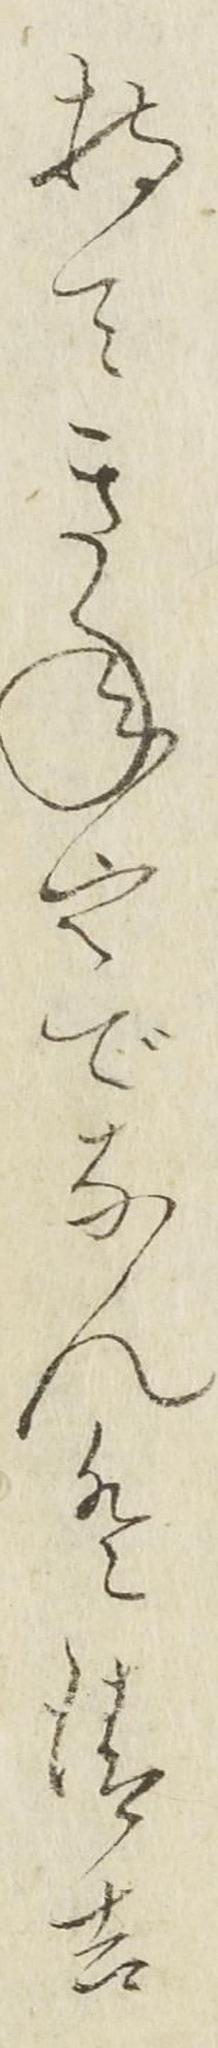持てまねしでなんと清吉
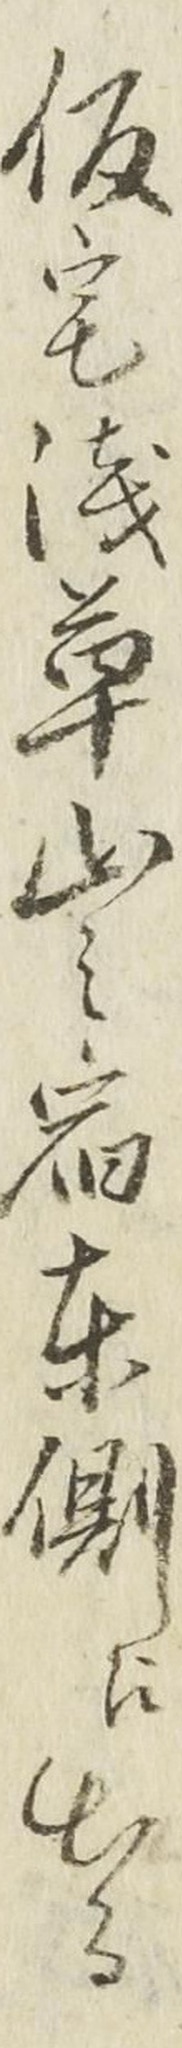仮宅浅草山之宿東側え出る
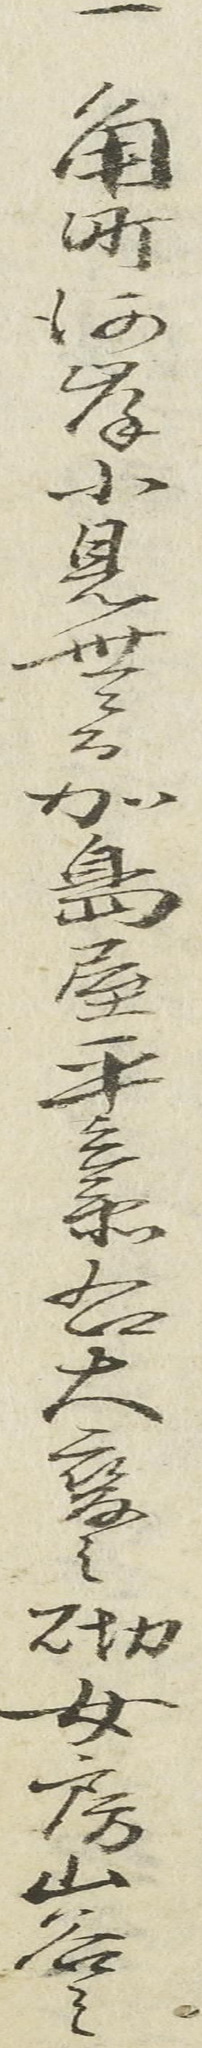一角町河岸小見世ニ而加島屋平兵衛右大変之砌女房山谷之
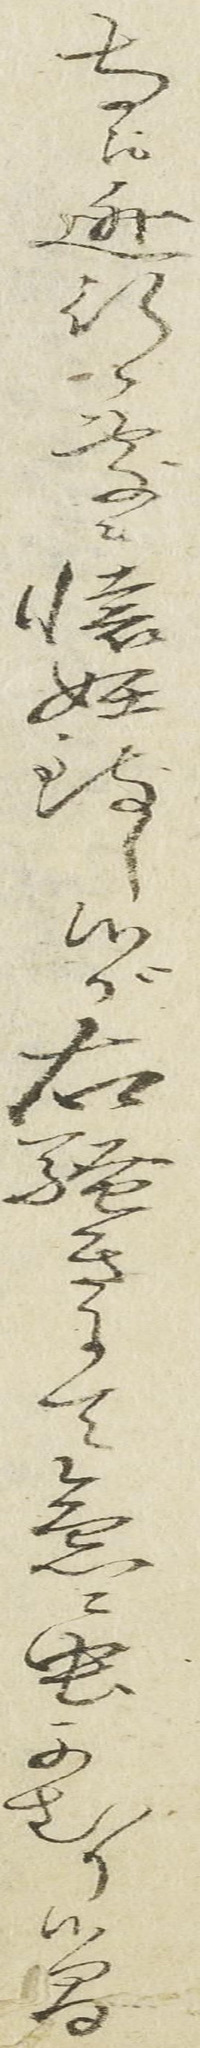寺え逃行候処二懐妊致し候が右騒ぎニテ急二虫かはり候間
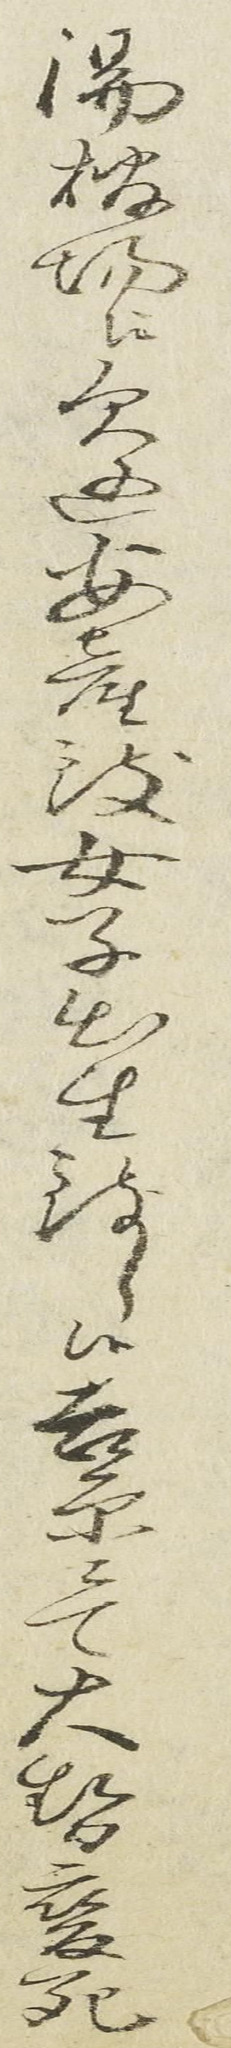湯棺場え欠込安産致女子出生致し候吉原ニて大勢変死
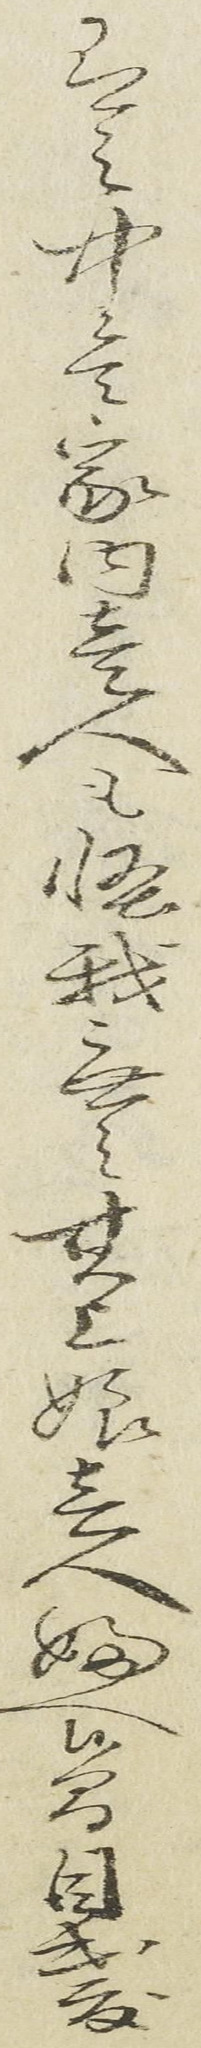有之中ニて家内壱人も怪我無之其上娘壱人ふへ候間目出度
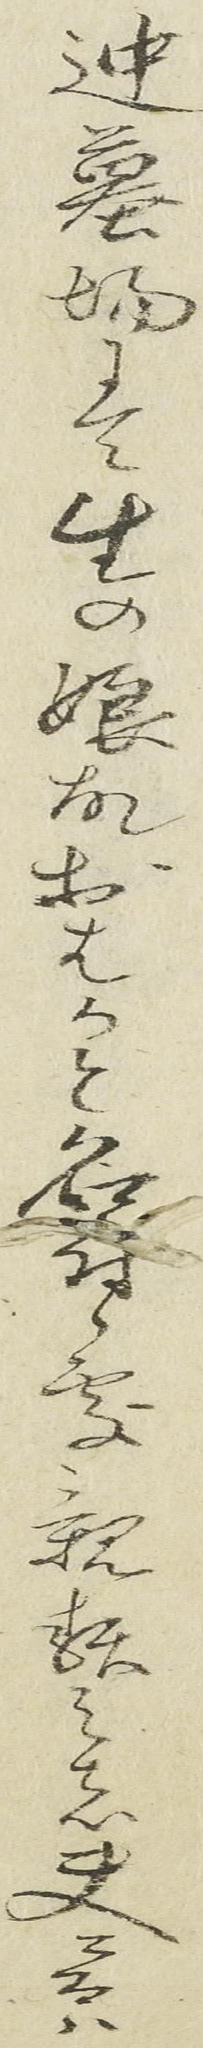迚墓場にて生の娘故おはかと名付候處親類之者夫ニ而ハ
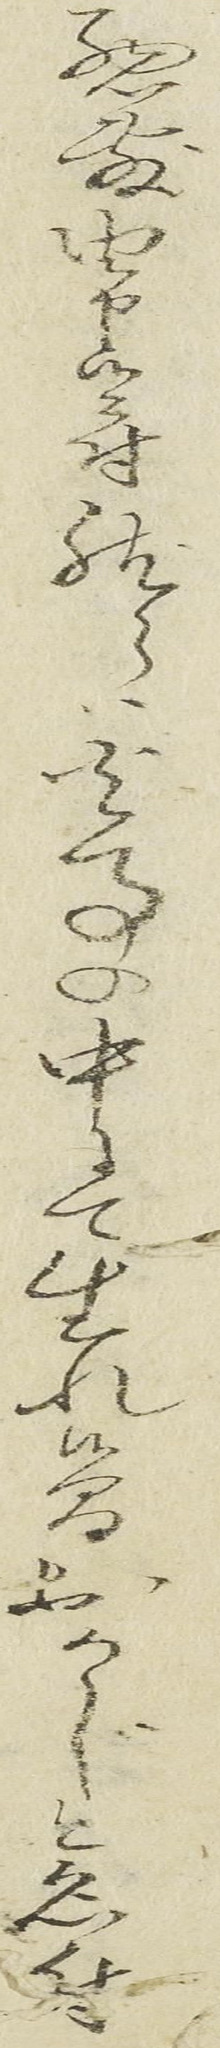悪敷由申候二付然らハ火事の中にて生れ候間おかじと名付

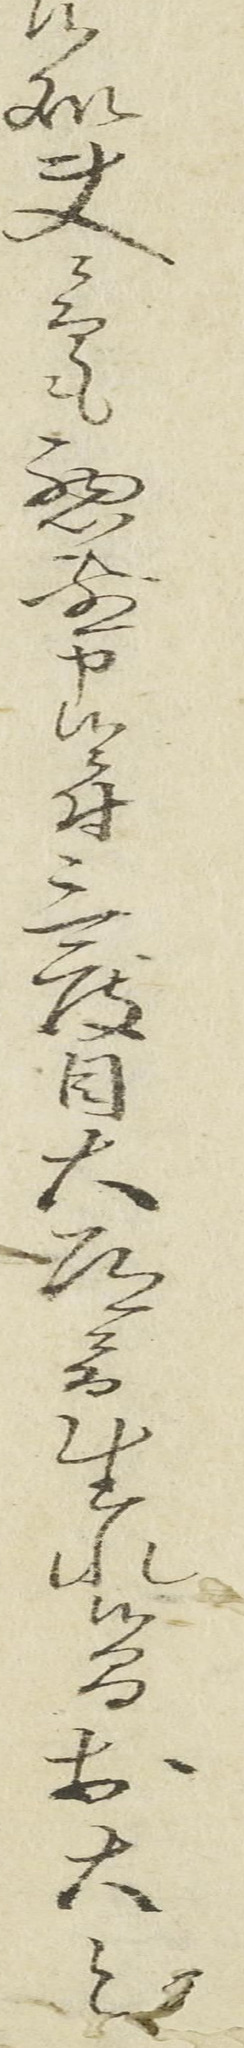候処夫ニ而も悪敷申候ニ付三度目大道ニ而生れ候間お大と
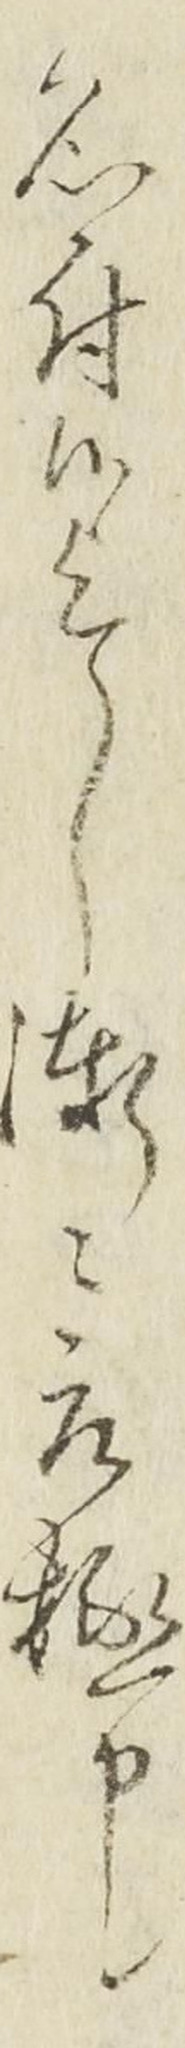名付候歟漸々取極申候
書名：安政二乙卯年十月二日大地震之事
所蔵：東京大学地震研究所図書室 Earthquake Research Institute Library, The University of Tokyo, JAPAN
